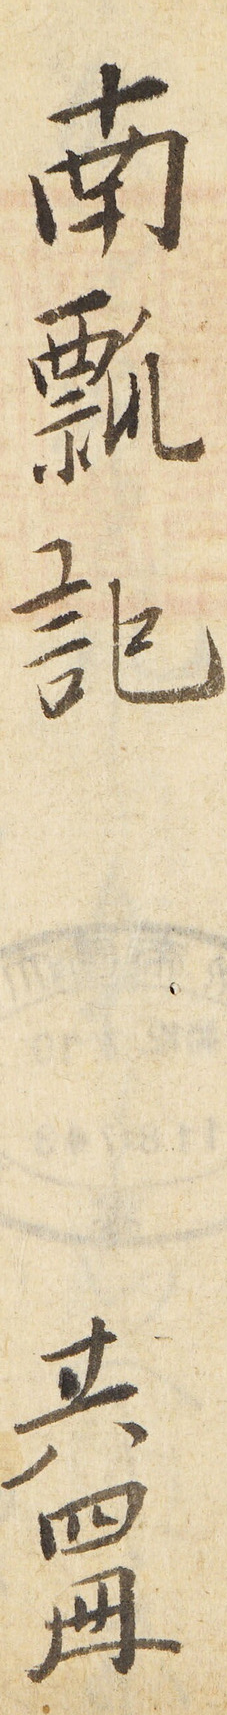南瓢記其四冊

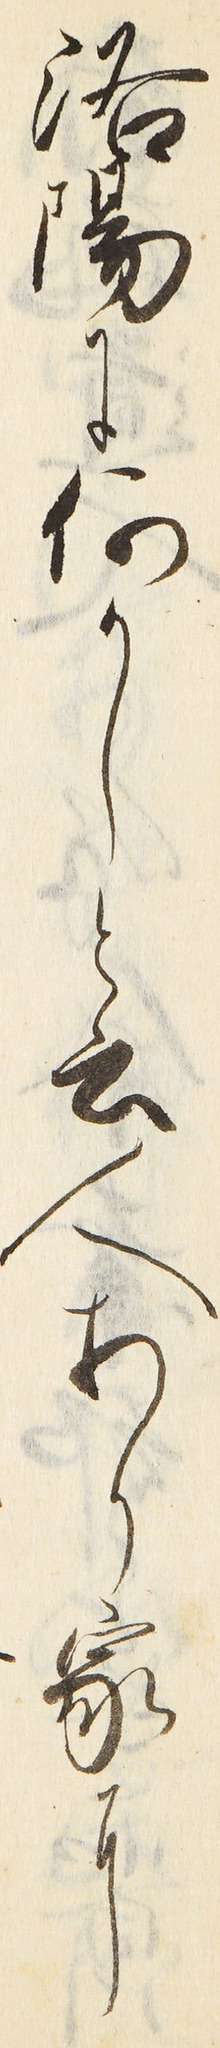洛陽に何かしと云人あり家に
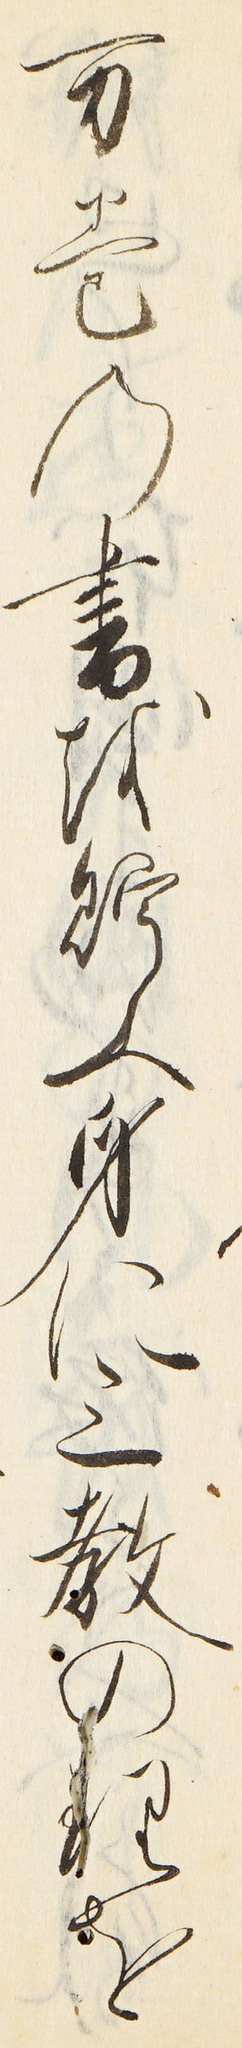万巻の書を貯へ身に三教の理を
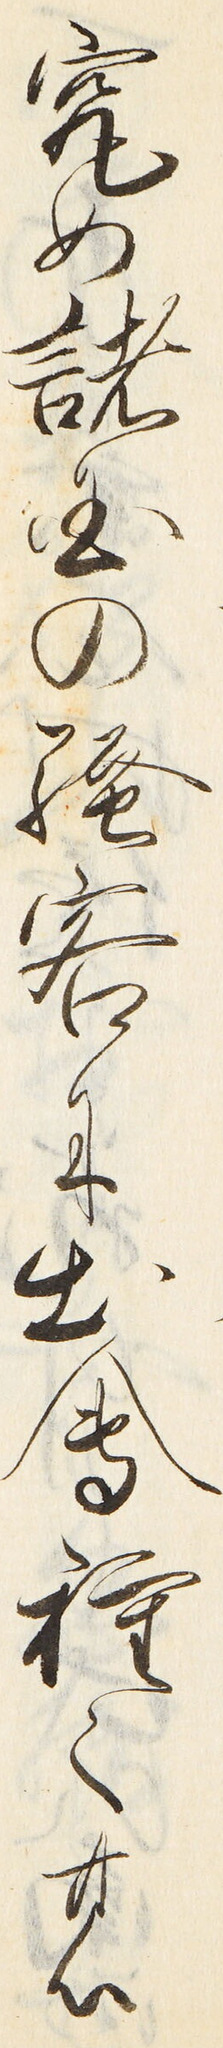究め諸国の騷客に出会種々の
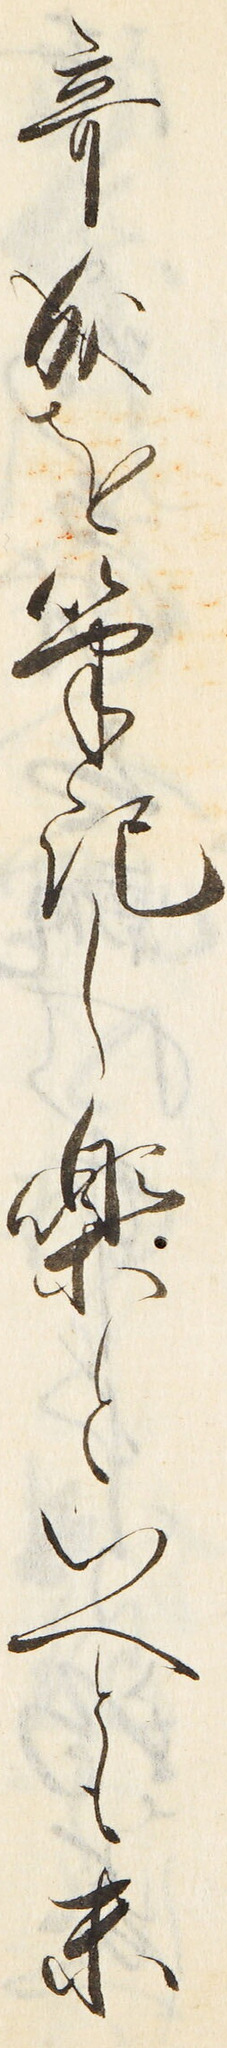奇成を筆記し楽といへとも未
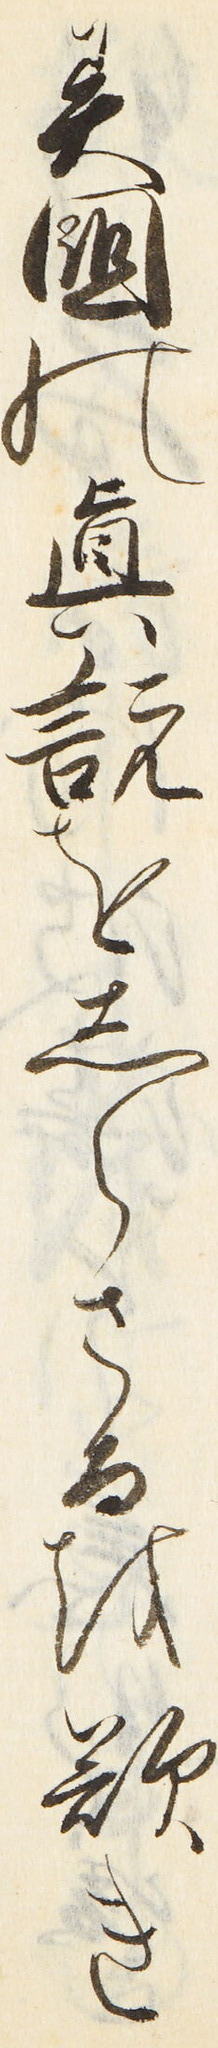異国の真説をしらさるを歎き
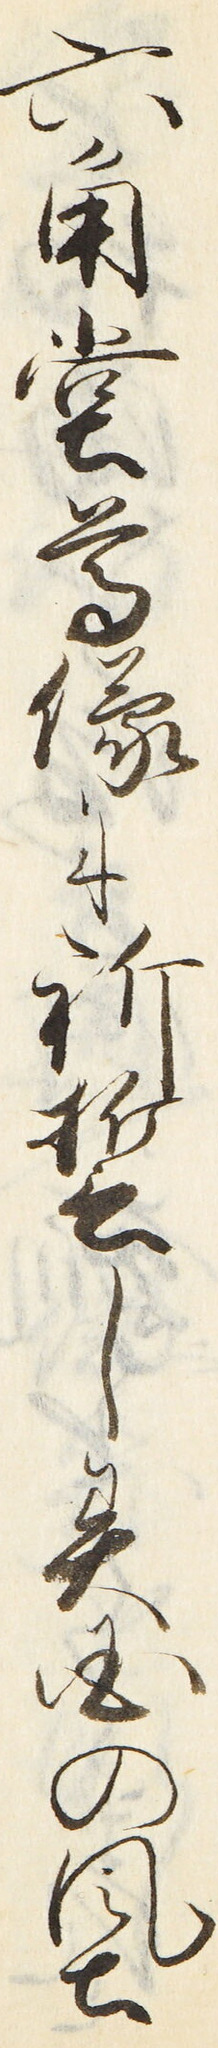六角堂尊像に祈誓し異国の風土
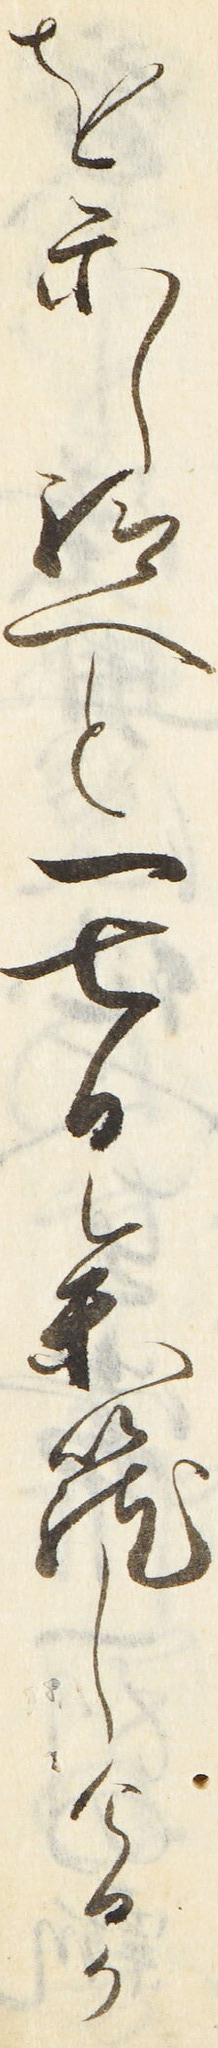を示し給ヘと一七日参籠しけるか
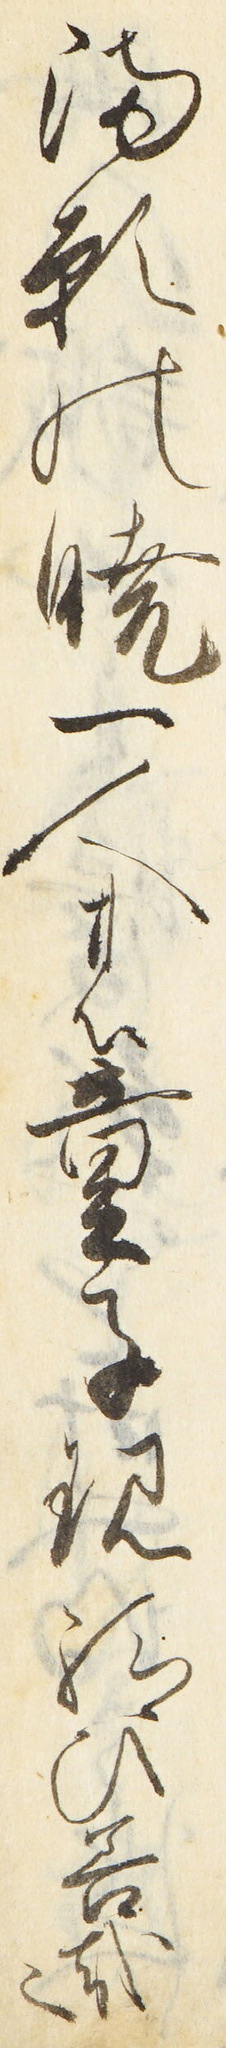満願の暁一人の童子現給ひ善哉々

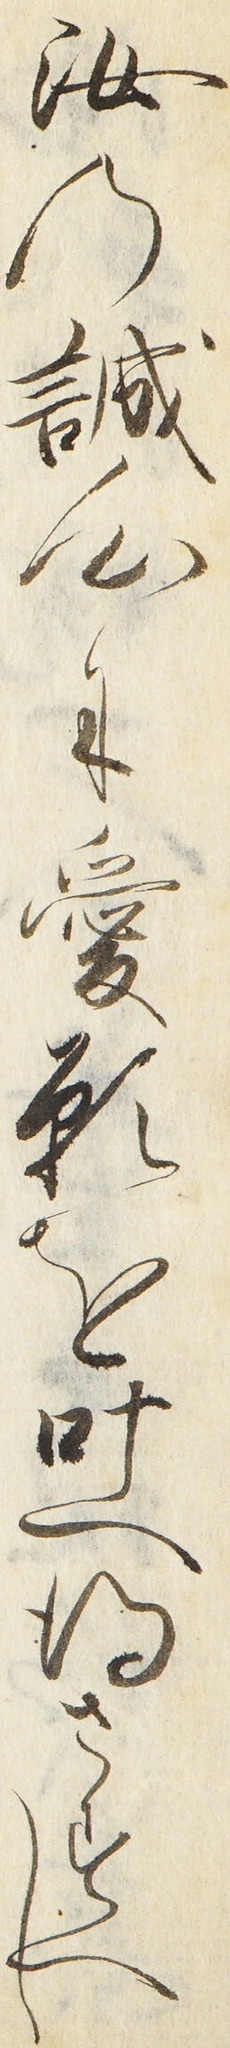汝の誠心に愛願を叶へ得さすへし
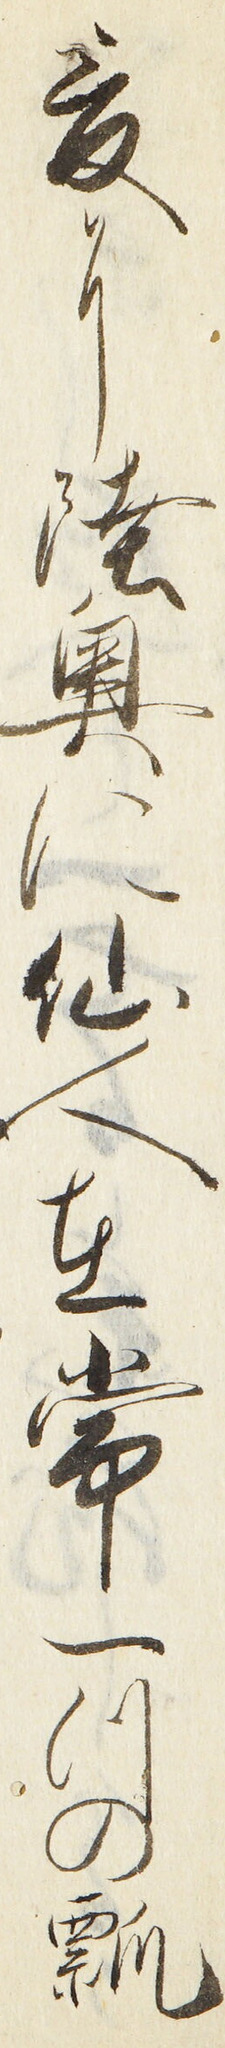爰に陸奥に仙人在常一つの瓢
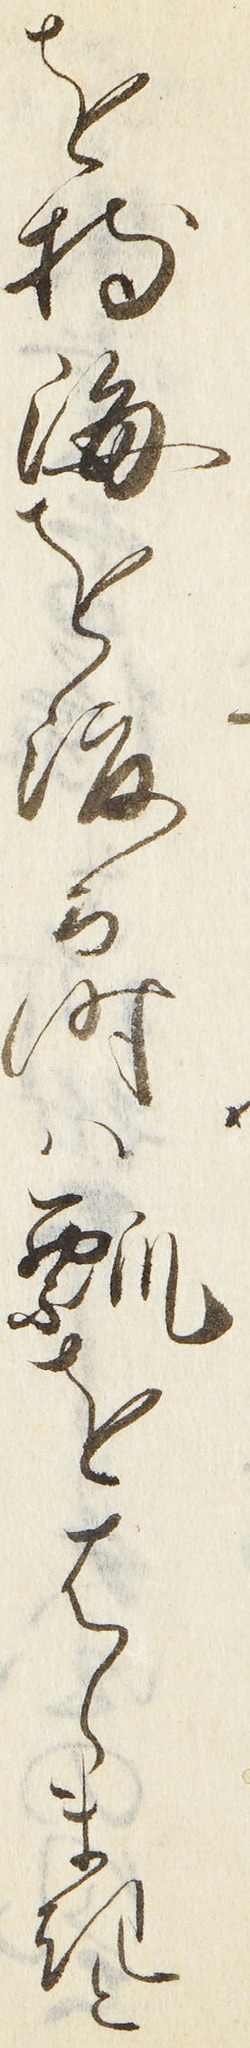を持海を渡る時は瓢をはらまきと
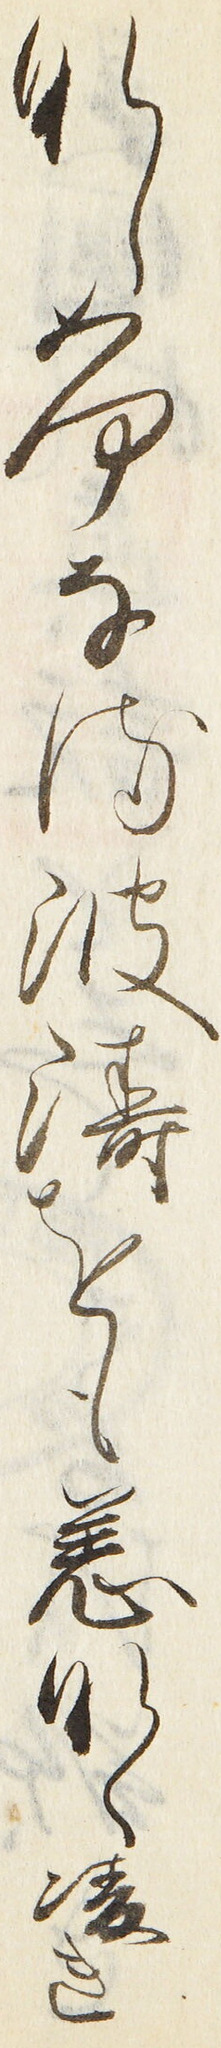なし如何なる波濤をも恙なく凌き
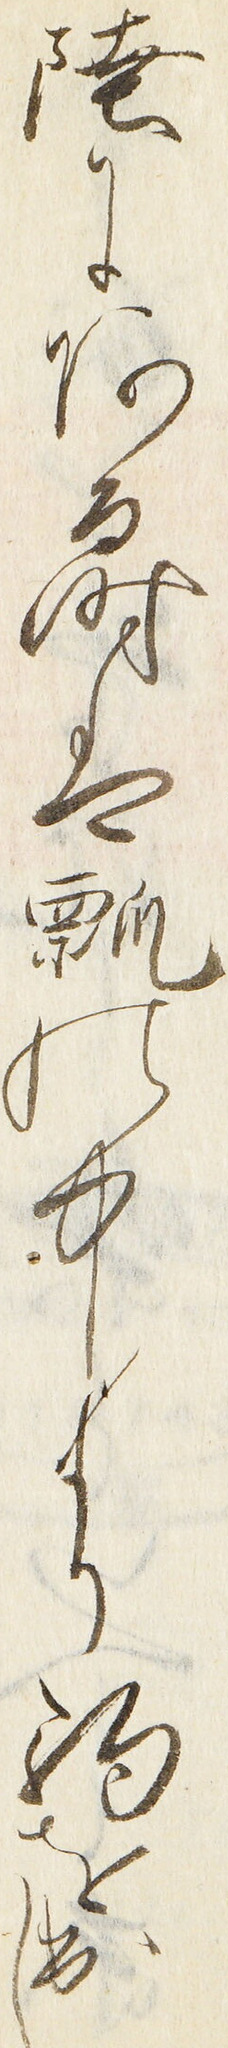陸にある時は瓢の中より駒を出し
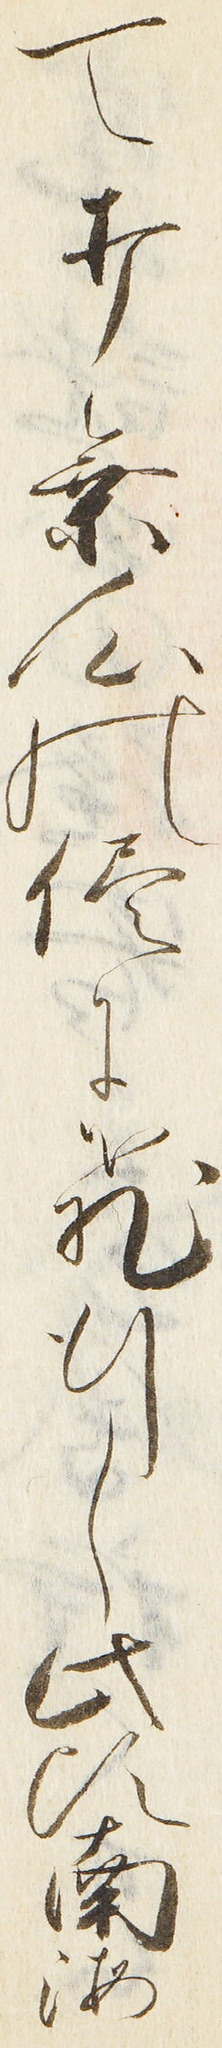て打乗心の侭に飛行し此頃南海
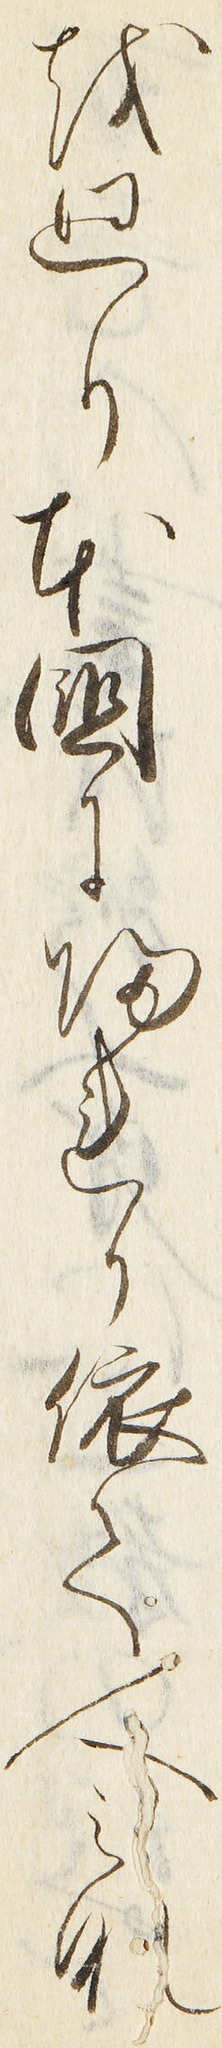を廻り本国に帰れり依て人みな
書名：南瓢記
